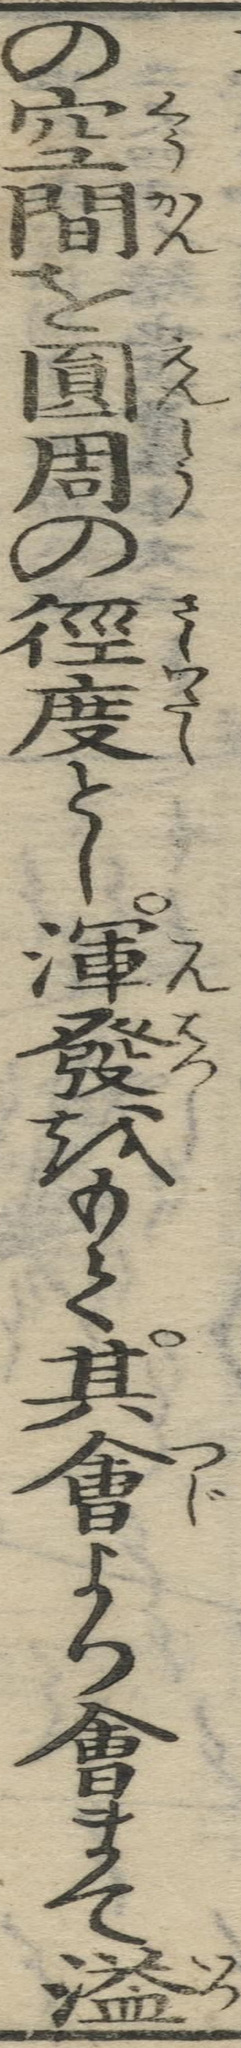の空間を圓周の径度とし。渾発をもて。其会より会まて溢
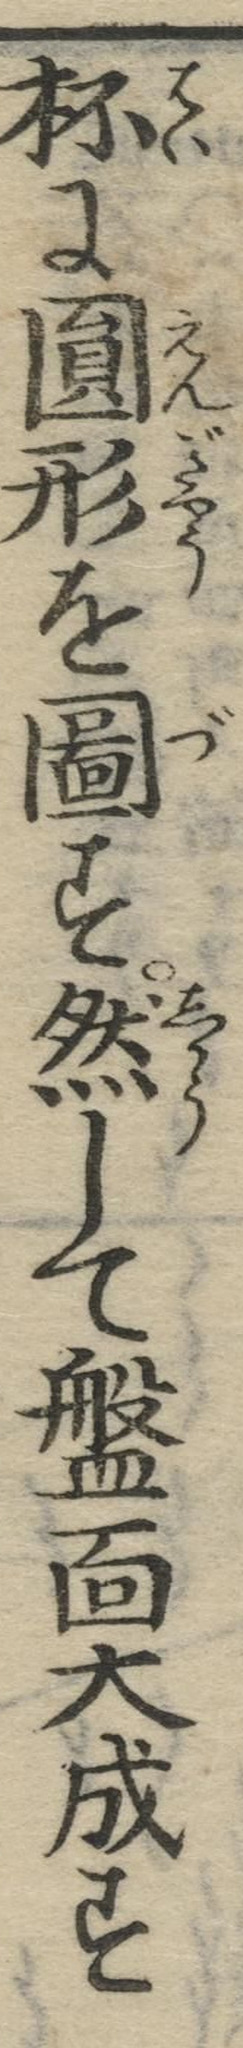杯に圓形を図す。然して盤面大成す
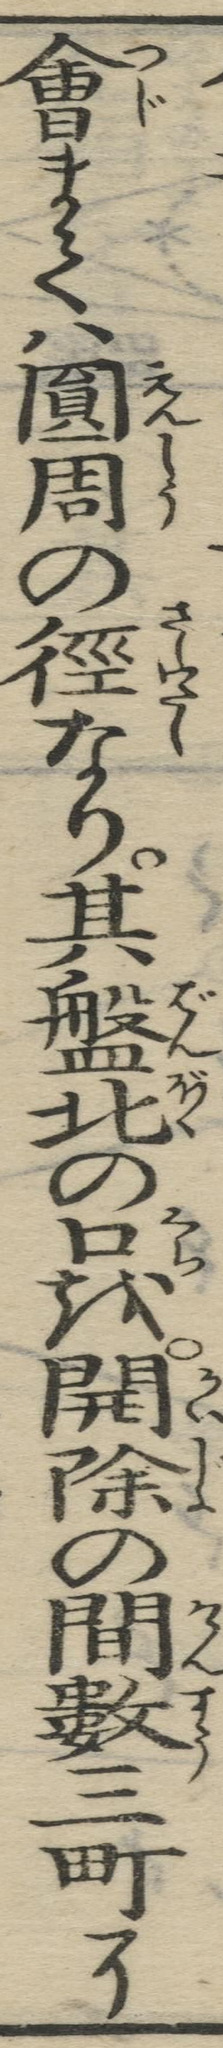会まては圓周の径なり。其盤北の口を。開除の間数三町に
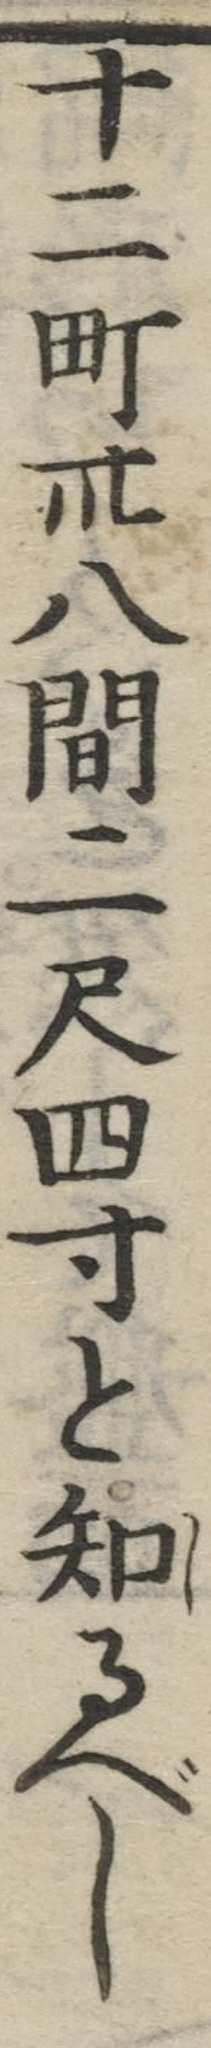十二町卅八間二尺四寸と知るべし
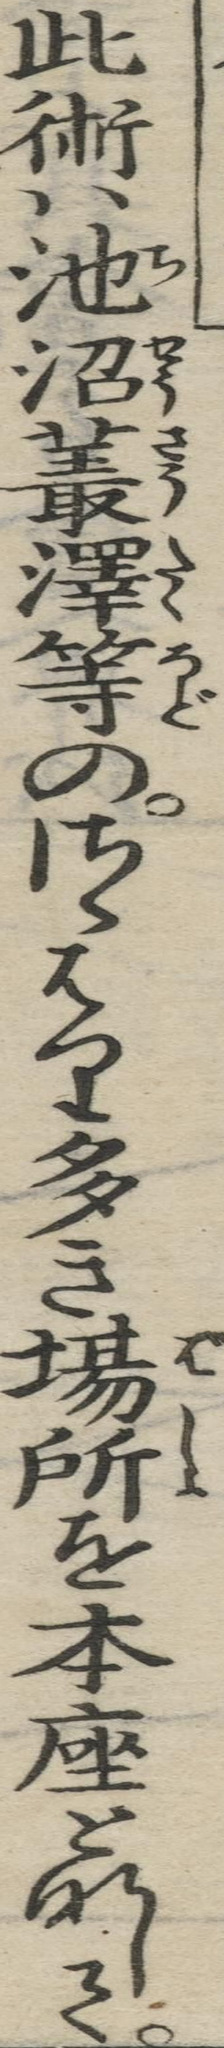此術は池沼叢澤等の。ささはり多き場所を本座となて。
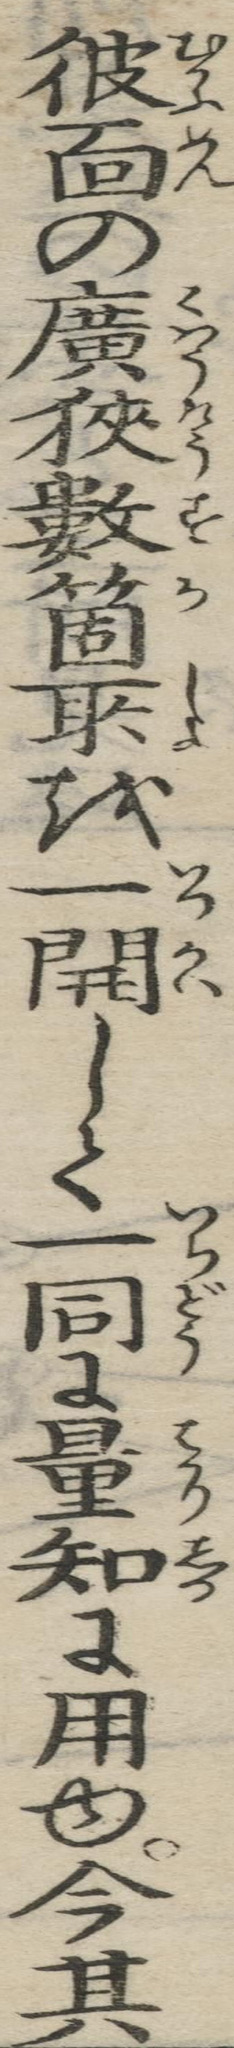彼面の広狭数箇取を一開して一同に量知に用ゆ。今其
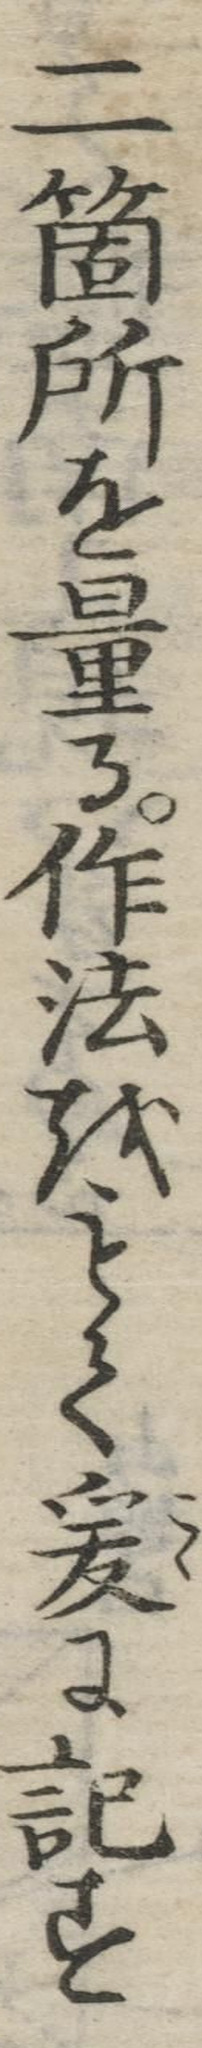二箇所を量る。作法をもて爰に記す
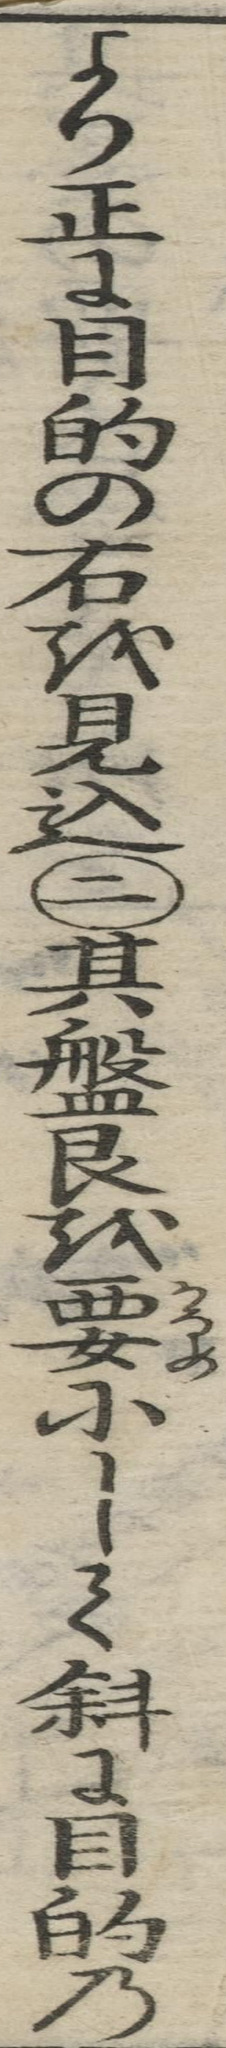より正に目的の右を見込㊁其盤艮を要にして斜に目的の
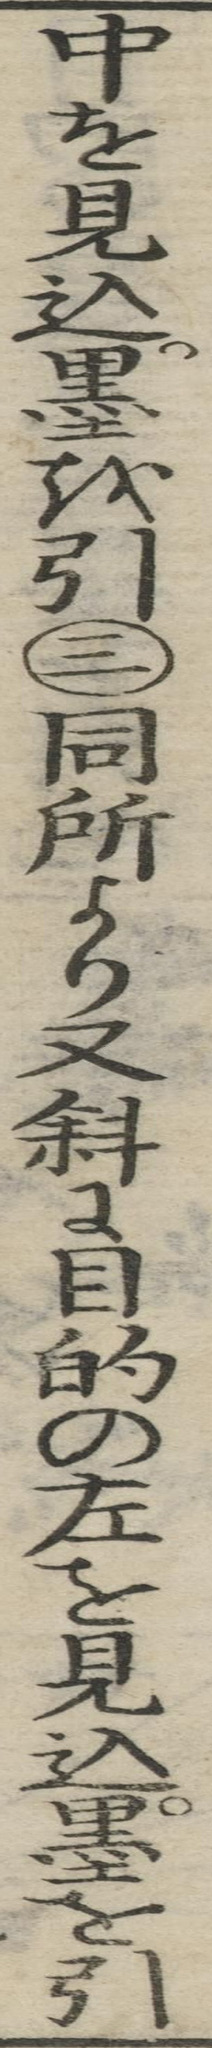中を見込。墨を引㊂同所より又斜に目的の左を見込。墨を引
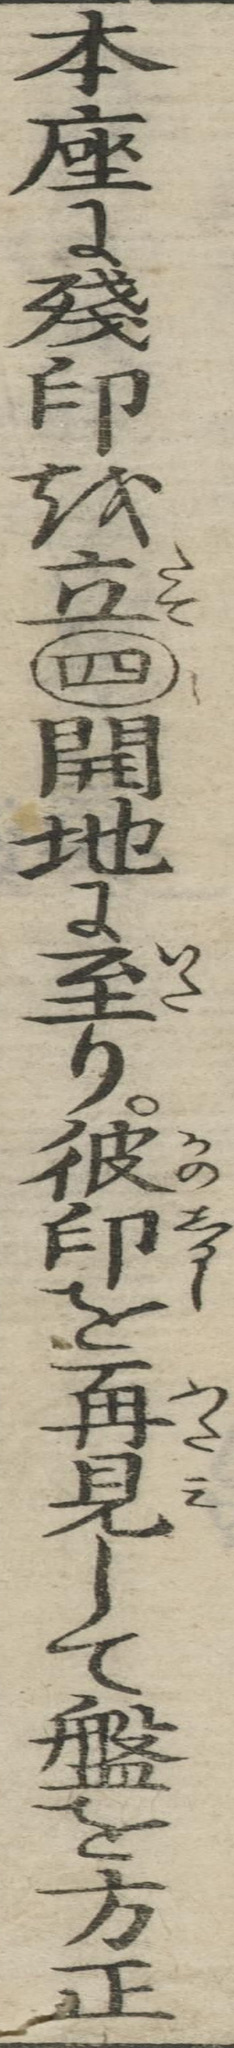本座に残印を立㊃開地に至り。彼印を再見して盤を方正

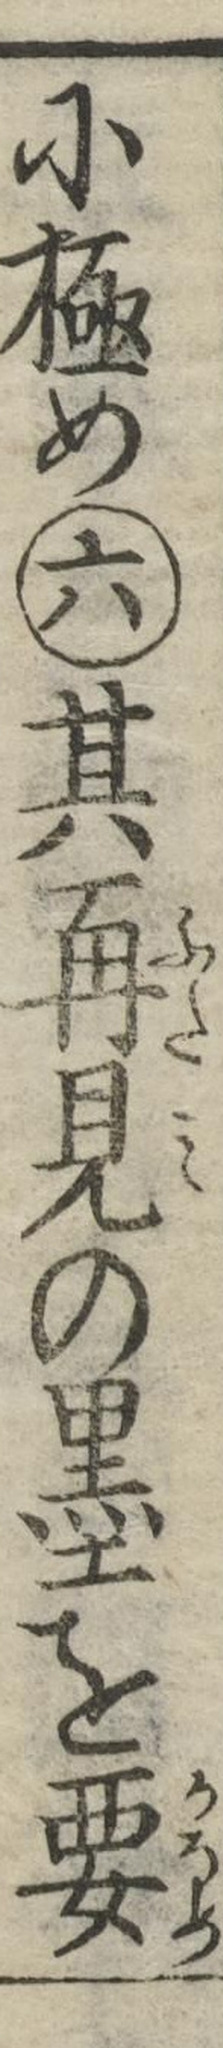に極め㊅其再見の墨を要
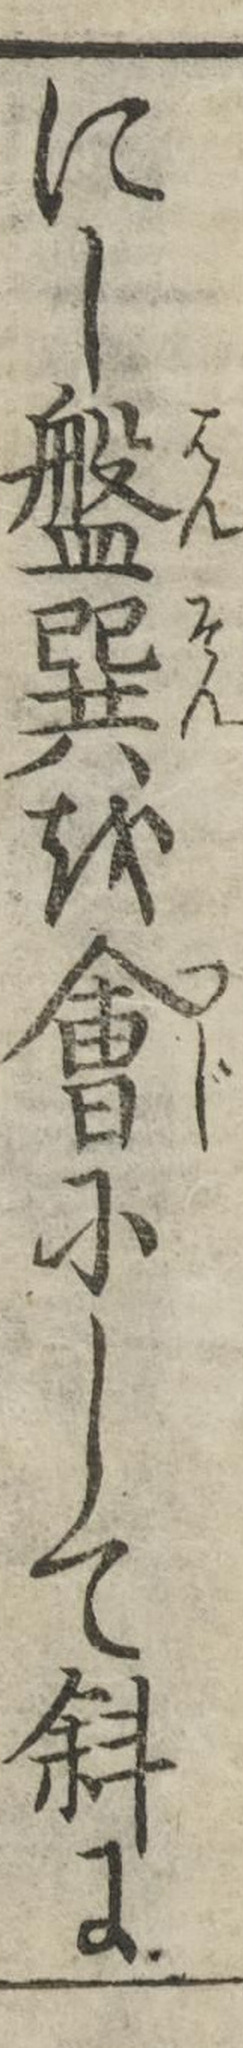にし盤巽を会にして斜に
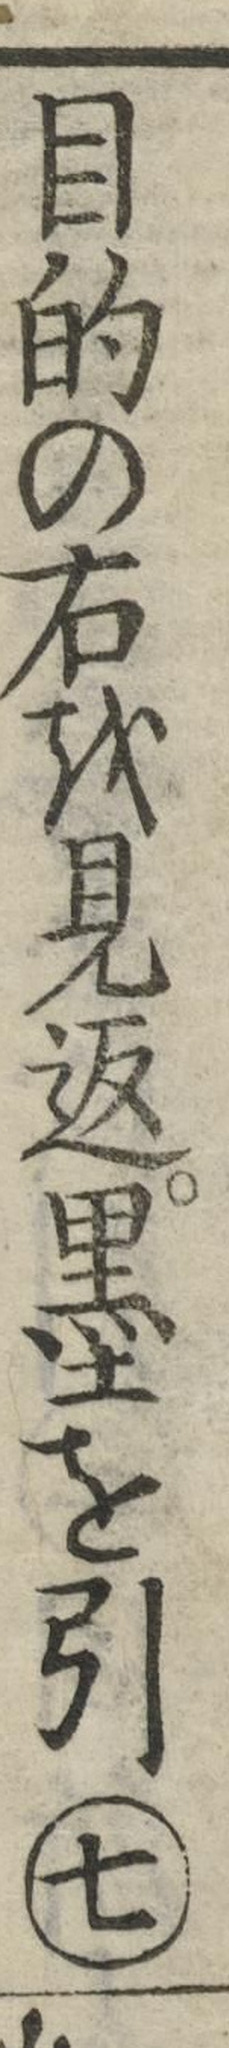目的の右を見返。墨を引㊆
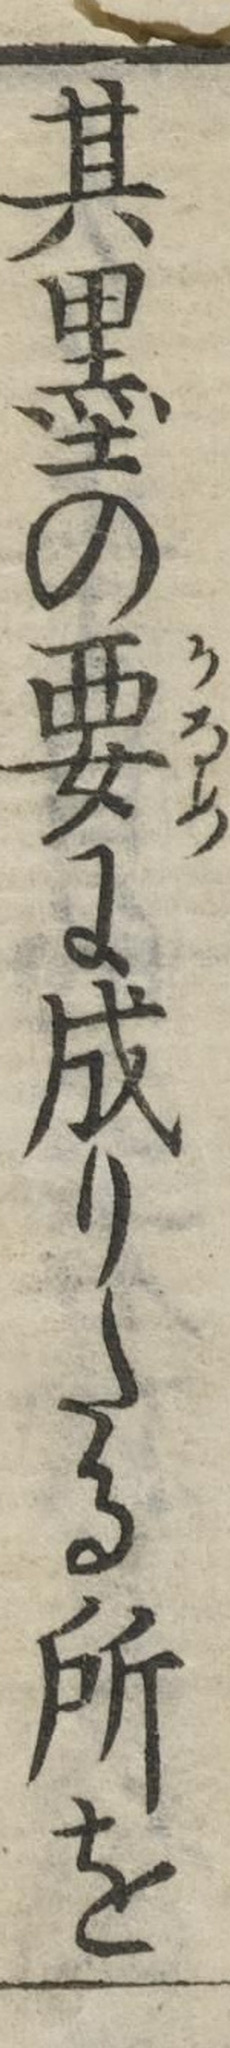其墨の要に成りたる所を
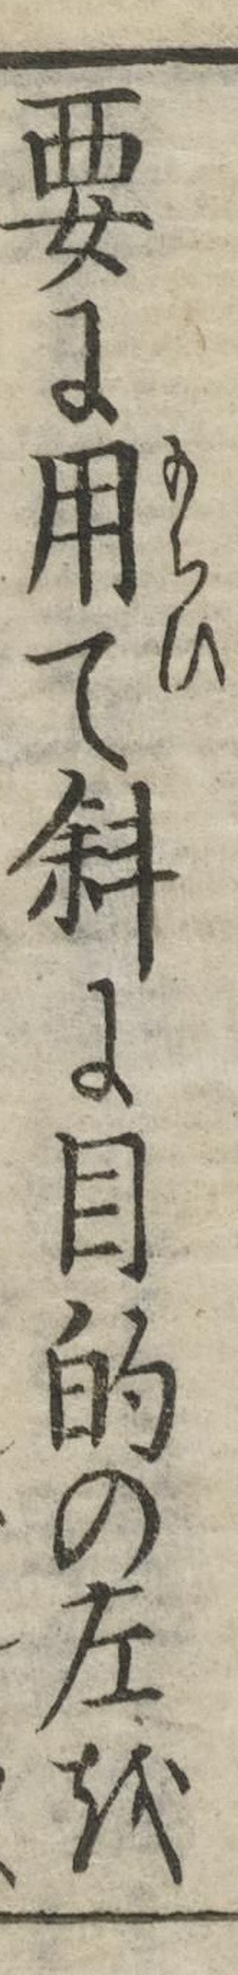要に用て斜に目的の左を
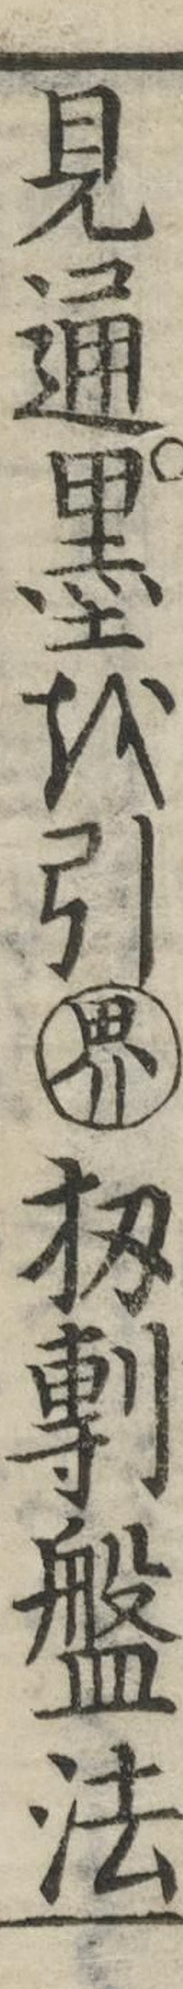見通。墨を引界扨剸盤法
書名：量地指南　巻之三（内題）
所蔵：東京大学地震研究所図書室 Earthquake Research Institute Library, The University of Tokyo, JAPAN
